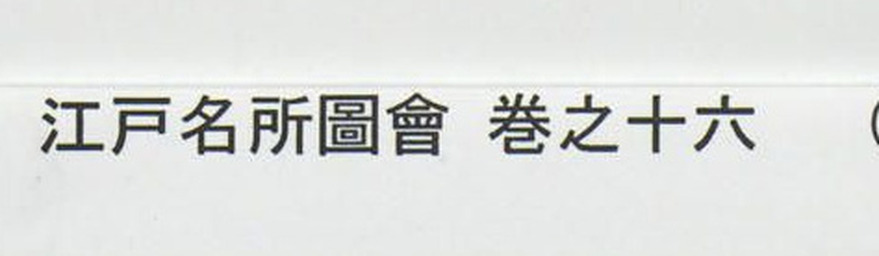江戸名所図會十六

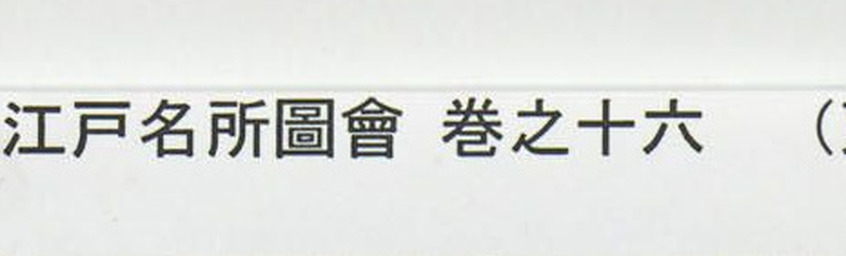江戸名所図会巻之六
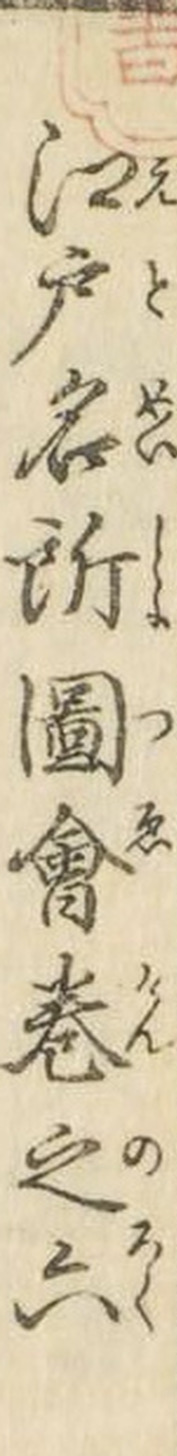江戸名所図会巻之六
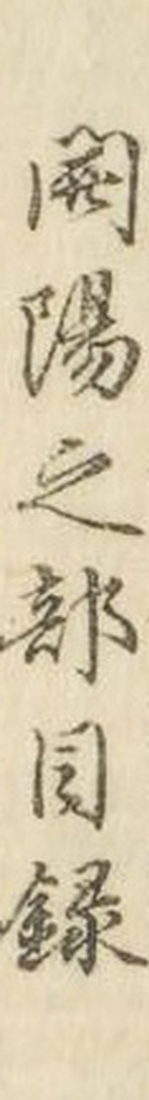開陽之部目録

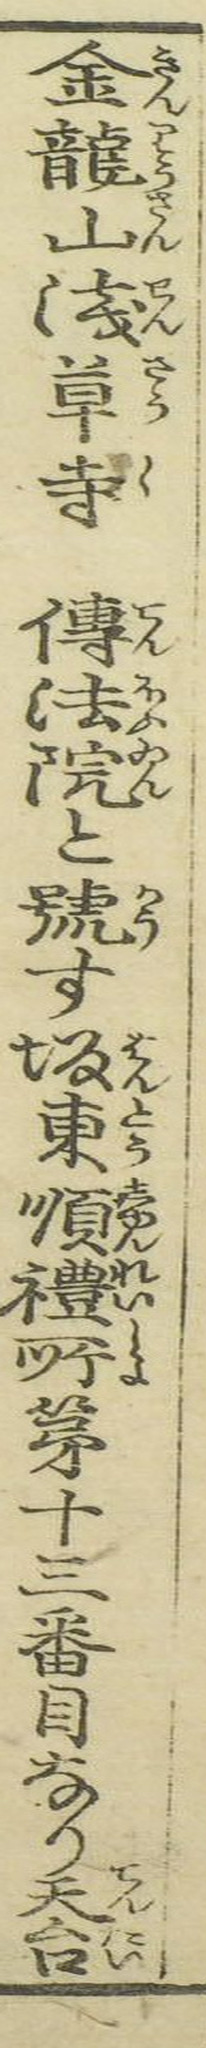金龍山淺草寺傳法院と號す坂東順禮所第十三番目なり天台
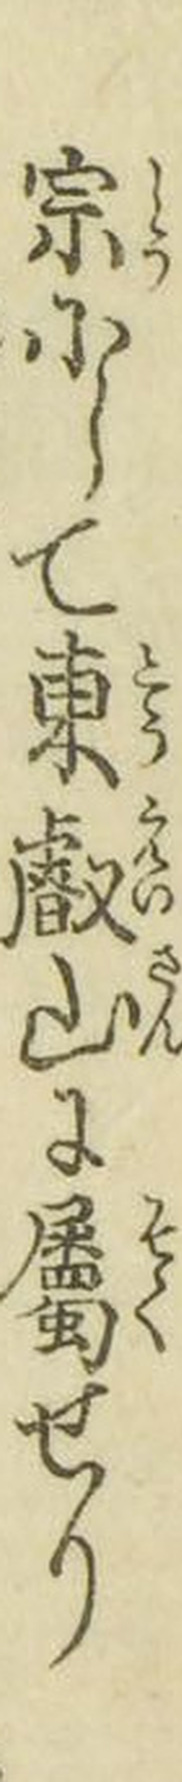宗にして東叡山に屬せり
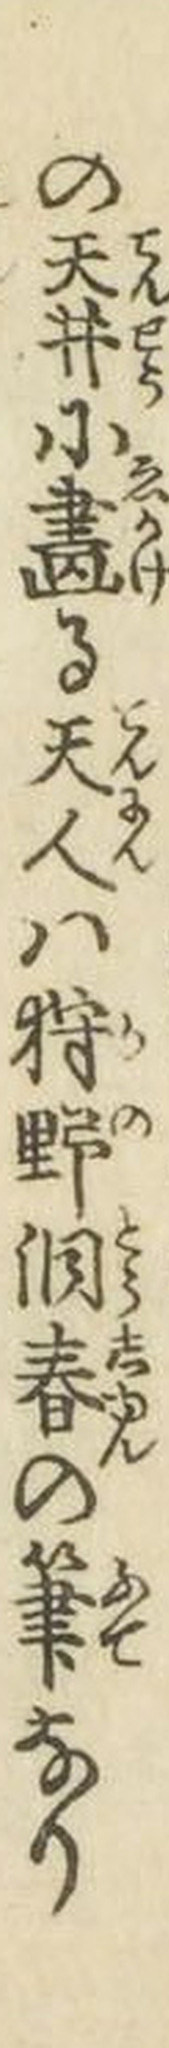の天井に畵る天人は狩野洞春の筆なり
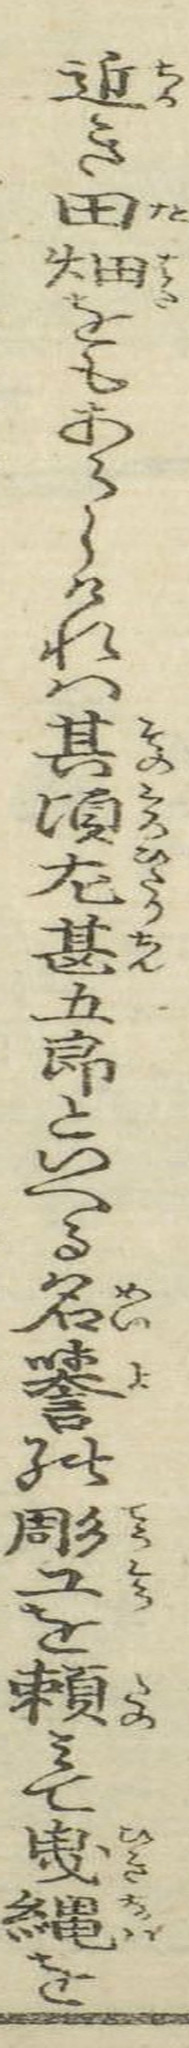近き田畑をもあらしけれは其頃左甚五郎といへる名譽の彫工を頼みて曳縄を

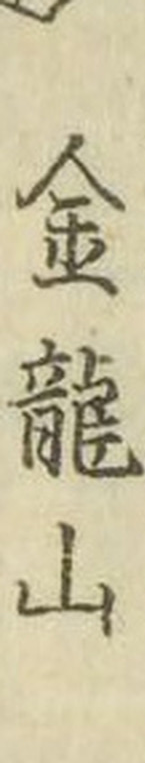金龍山
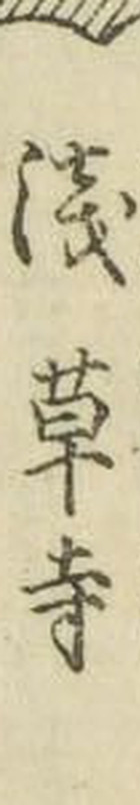淺草寺
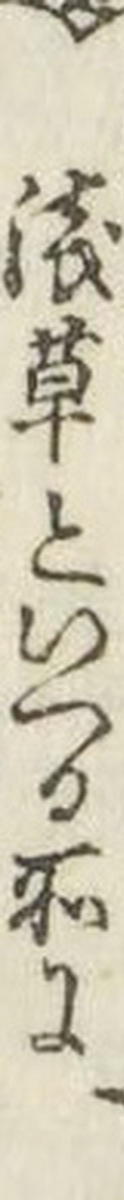淺草といへる所に
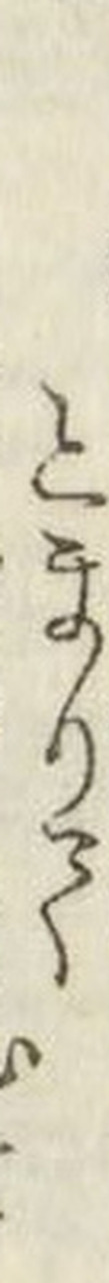とまりて
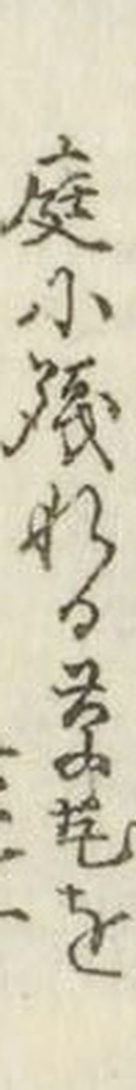庭に殘れる草花を
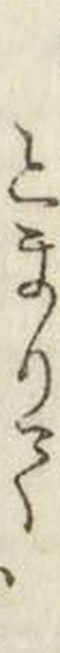とまりて
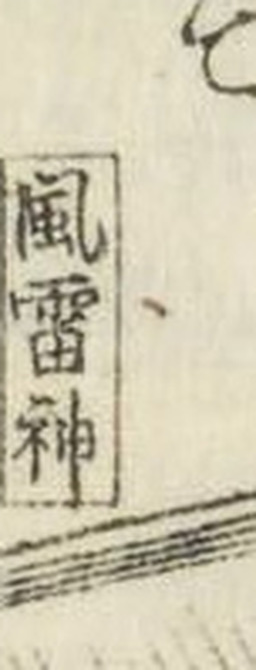風雷神
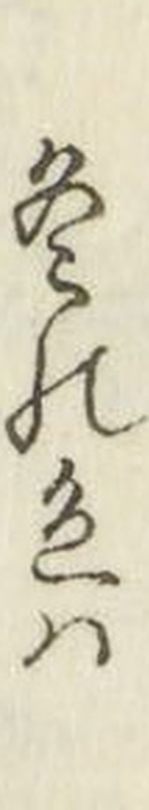冬の色は
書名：江戸名所図会 20巻 巻之16
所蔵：東京学芸大学教育コンテンツアーカイブ
